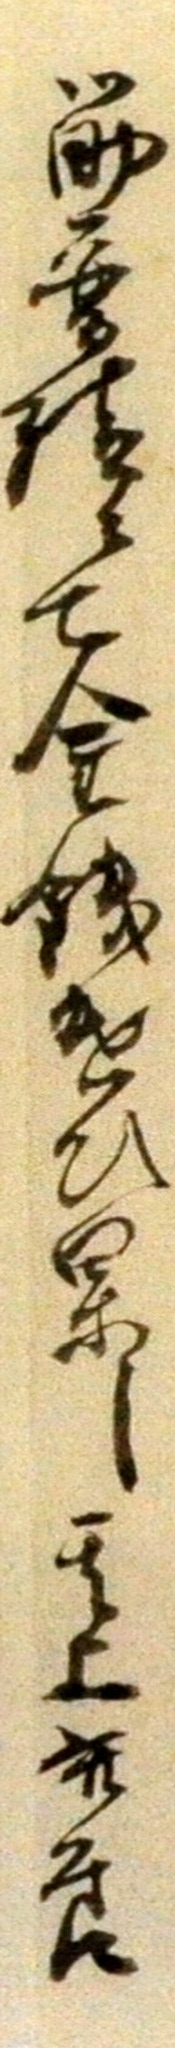筋普請二て金銭遣ひ果し其上此節
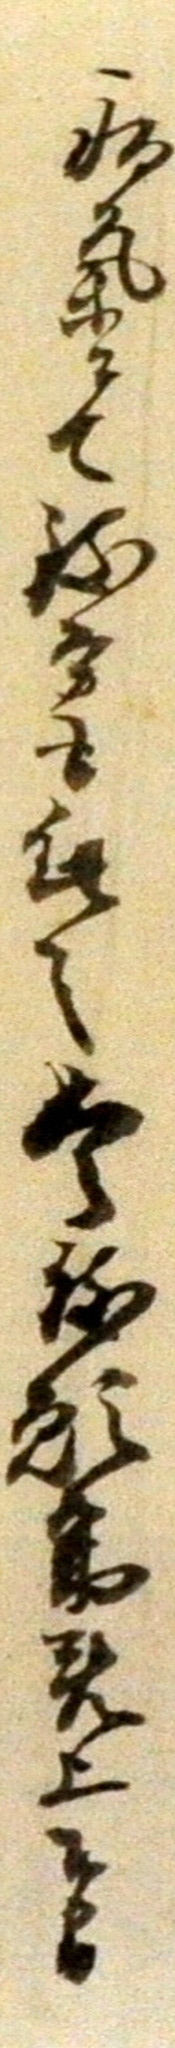病気二て致ケも無之今度願書差上之間
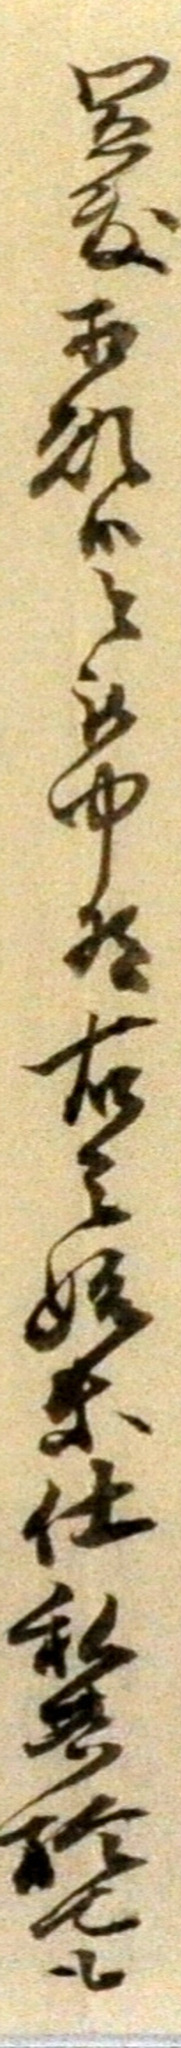宜敷相願候と被申候右之始末仕私暮於ても
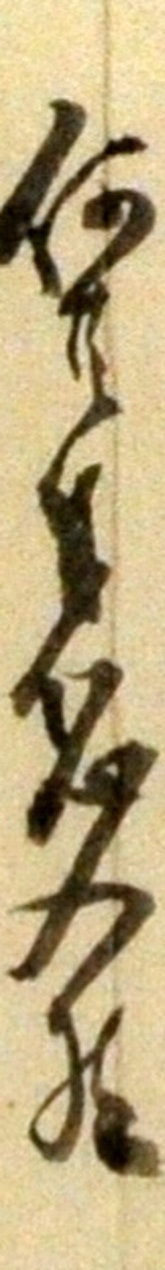何共奉恐入候
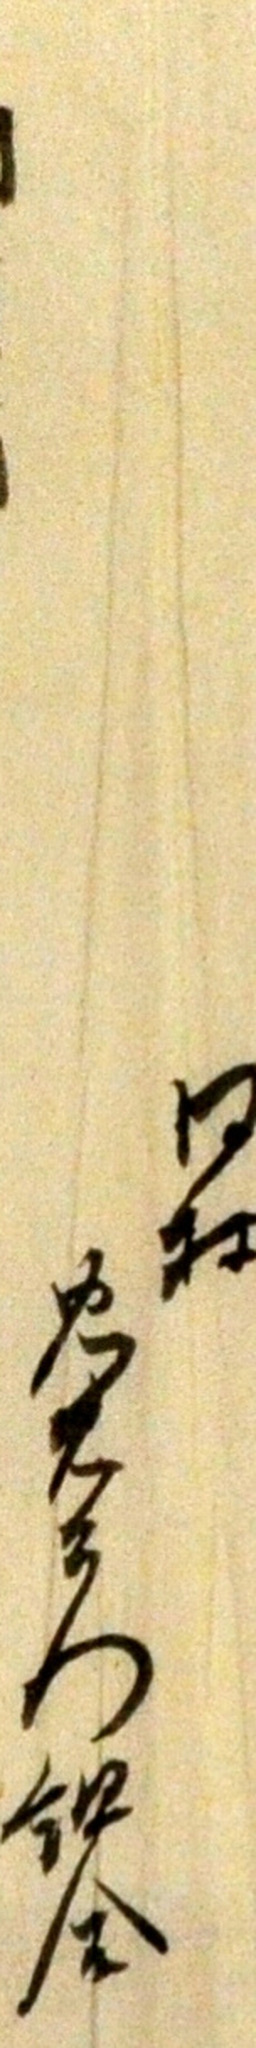忠右衛門組合
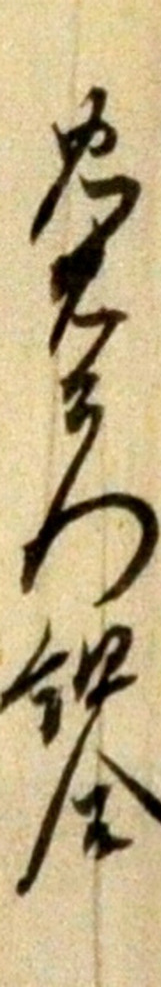忠右衛門組合
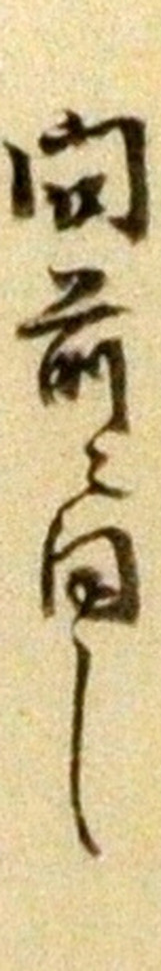問前ニ同じ
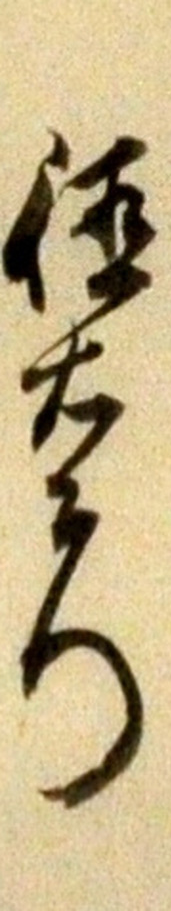徳右エ門
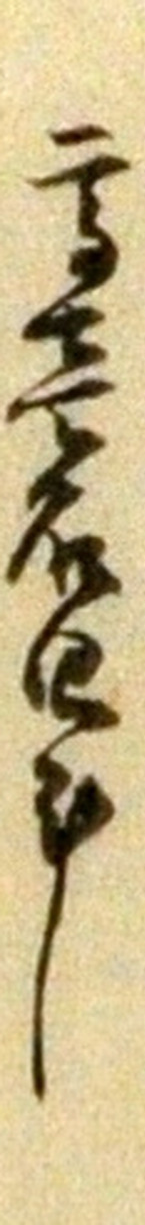高壱石四斗
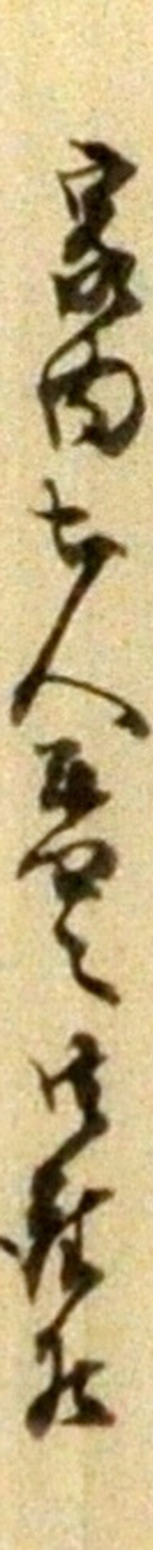家内七人暮し御座候
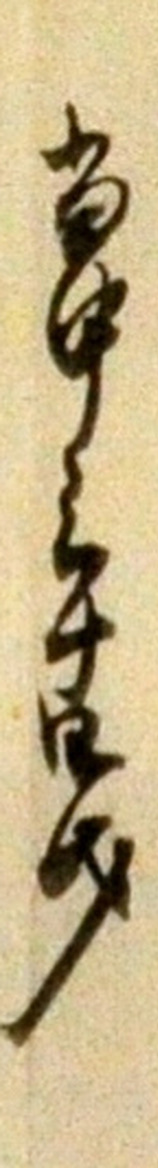当甲三十四才
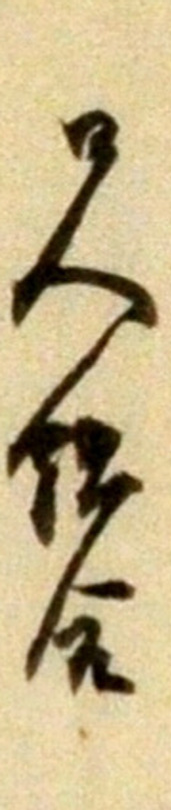同人組合
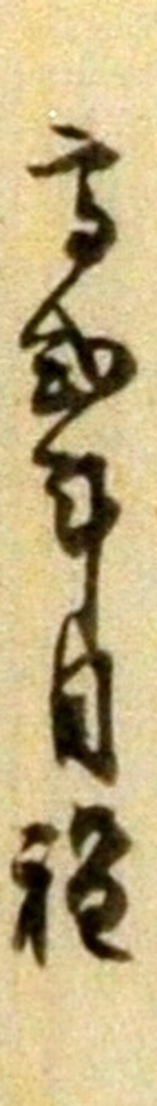高弐斗目禮
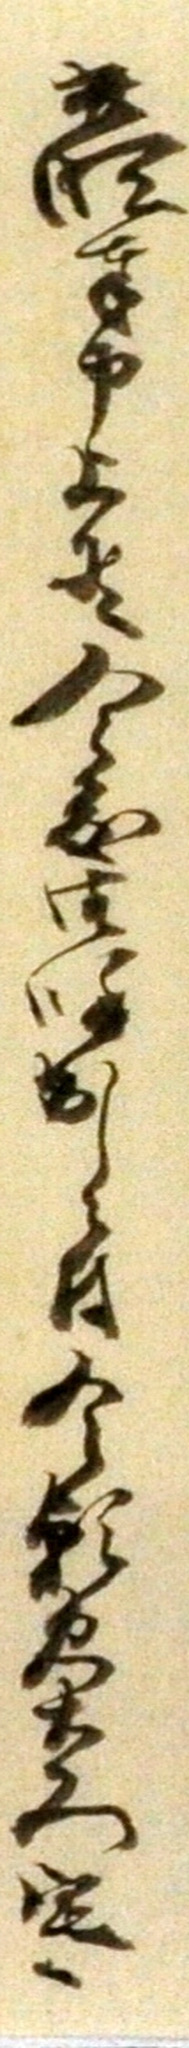此段奉申上候今度御呼出し候付今朝忠右衛門迄ニ
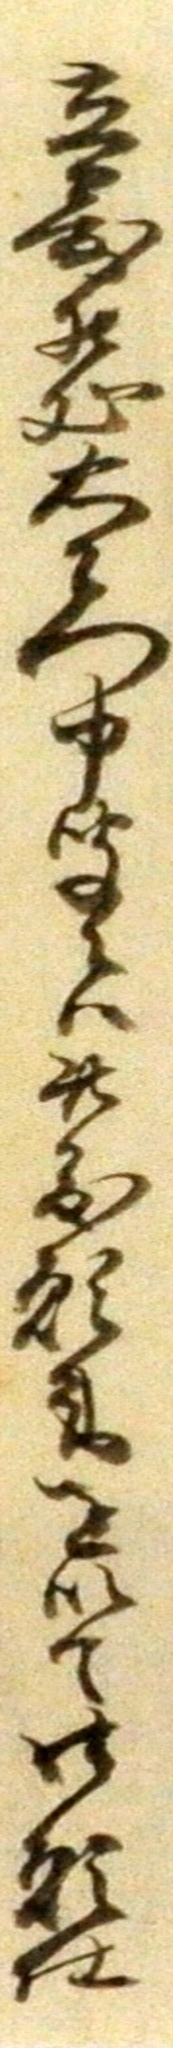立寄候処忠右衛門申聞候ㇵ此度願書を以て御願仕
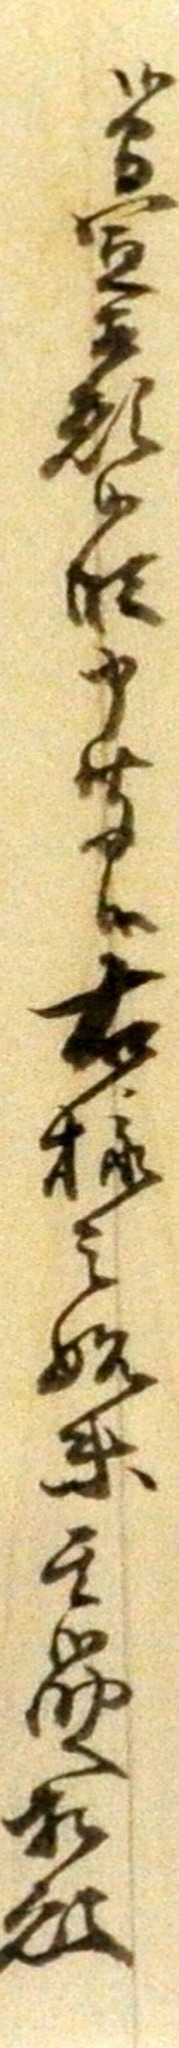候間宣相願申段申聞候右様始末其筋へ相願
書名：中沢村駕籠訴事件書類写
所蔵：伊那市立高遠町図書館・合同会社AMANE
